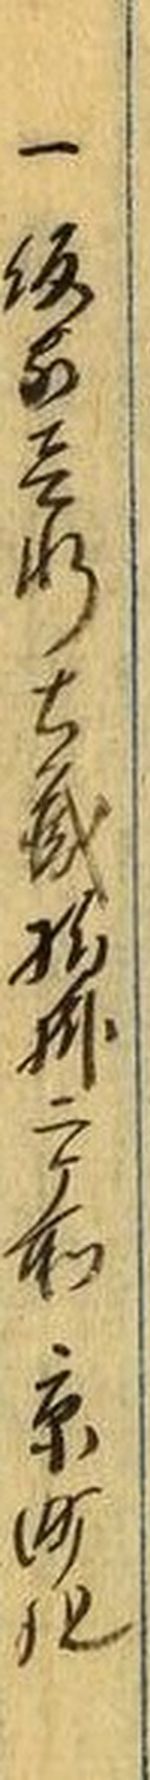一仮家壱軒土蔵指掛二ヶ所京町組
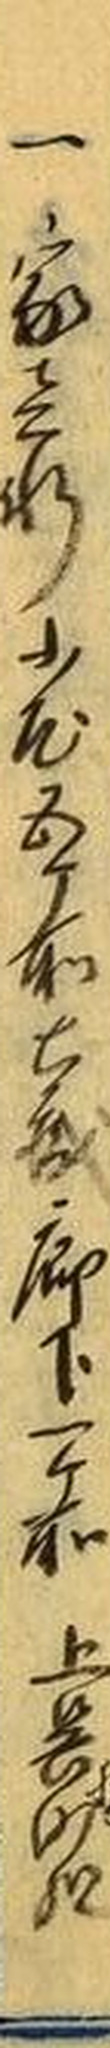一家壱軒小屋五ヶ所土蔵廊下一ヶ所上呉服町組
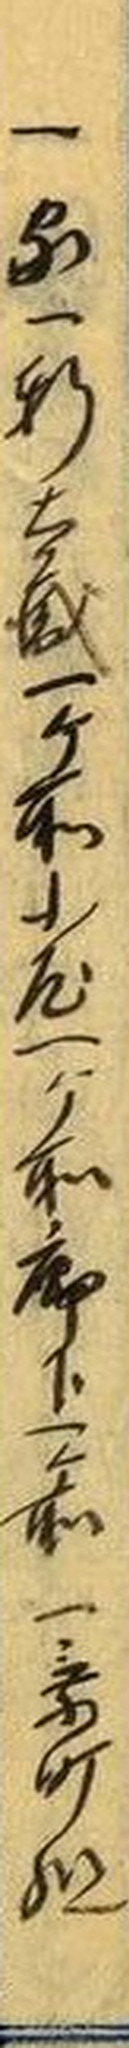一家一軒土蔵一ヶ所小屋一ヶ所廊下一ヶ所一乗町組
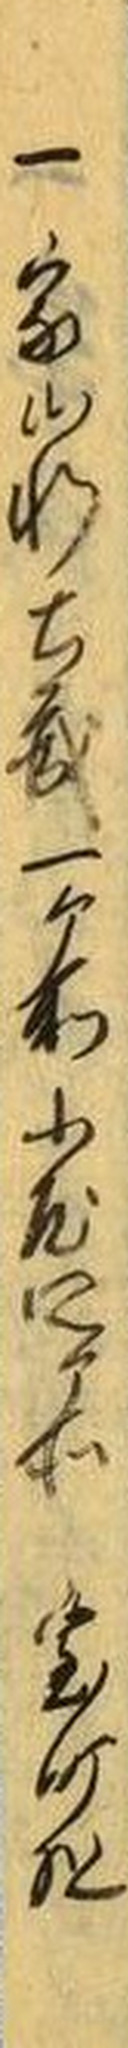一家弐軒土蔵一ヶ所小屋四ヶ所室町組

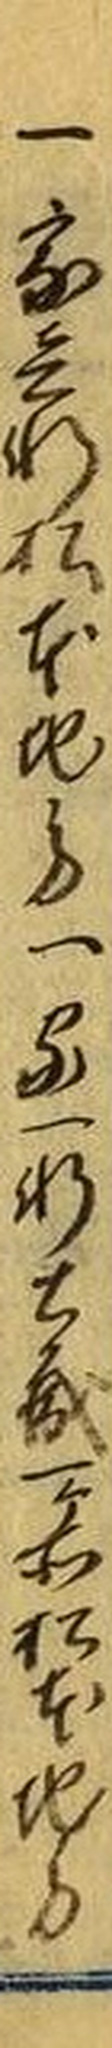一家壱軒松本地方一家一軒土蔵一ヶ所松本地方
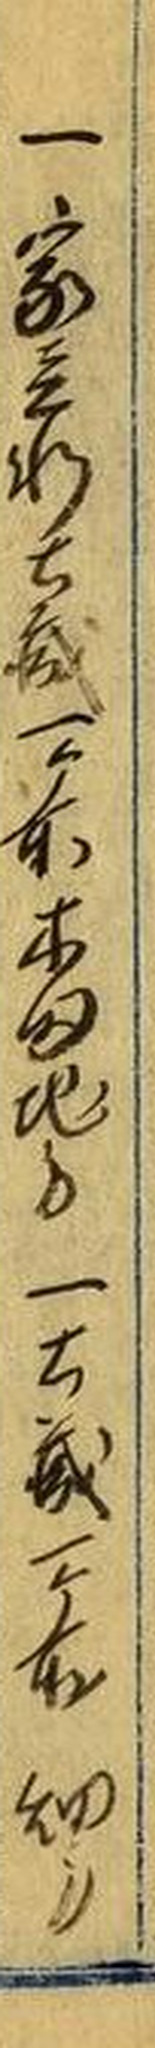一家壱軒土蔵一ヶ所木田地方一土蔵一ヶ所畑方
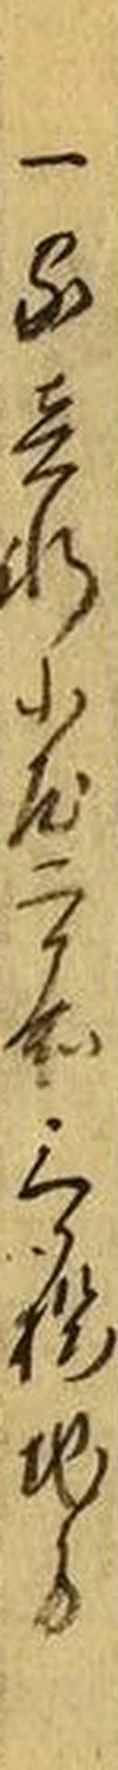一家壱軒小屋二ヶ所三ツ橋地方
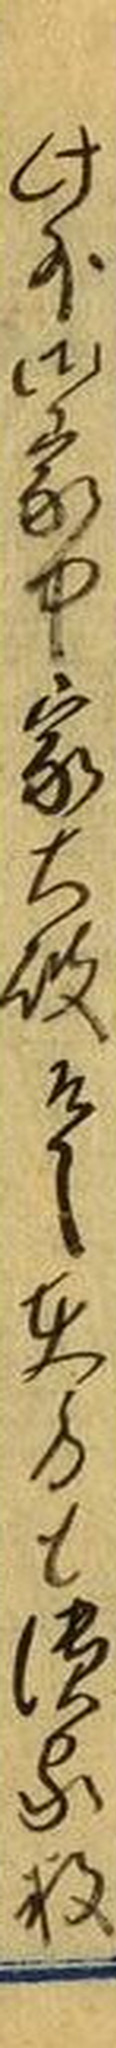此外御家中家大破有之在方も潰家数
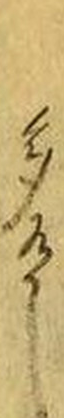多有之
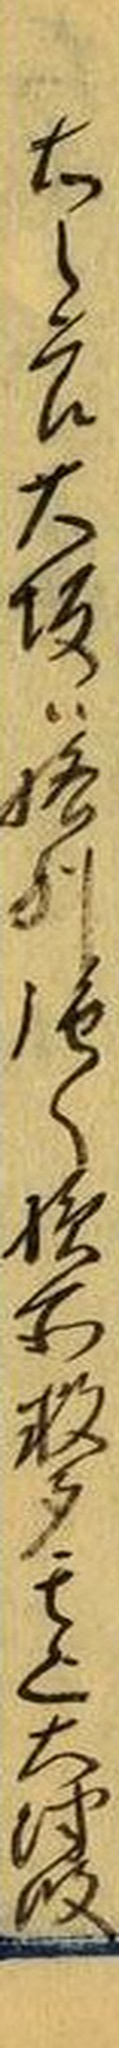右之節大坂ハ格別強く損所数多其上大津波
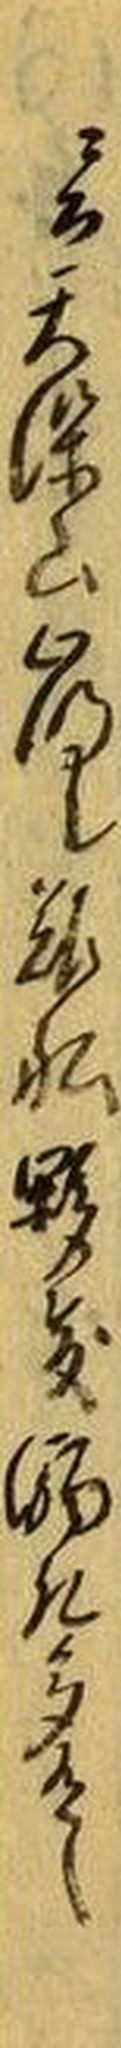ニ而天保山崩レ難船夥敷溺死多有之
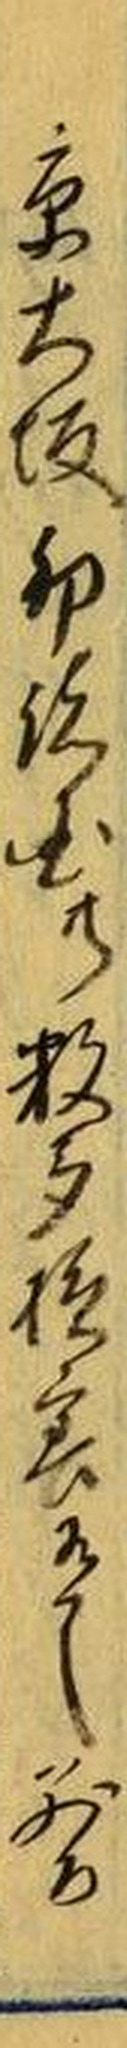京大坂初諸国共数多損害有之別而
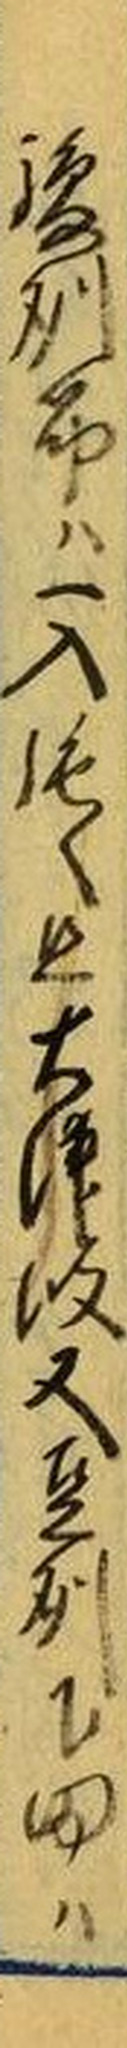駿州筋ハ一入強く且大津波又豆州下田ハ
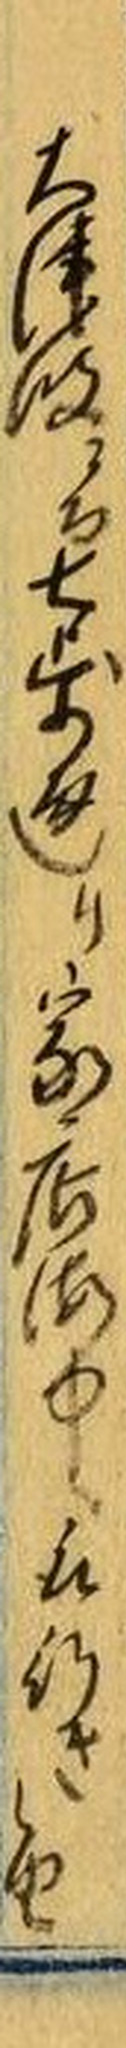大津波ニ而七歩通り家店海中へ取行き候由
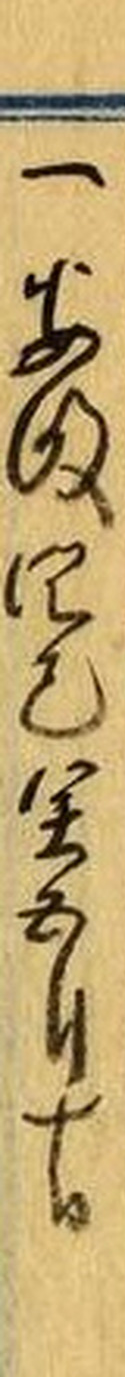一安政四巳閏五月十日
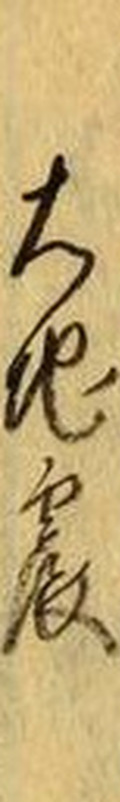大地震
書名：温古集 五巻
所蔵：福井県文書館 Fukui Prefectural Archives
